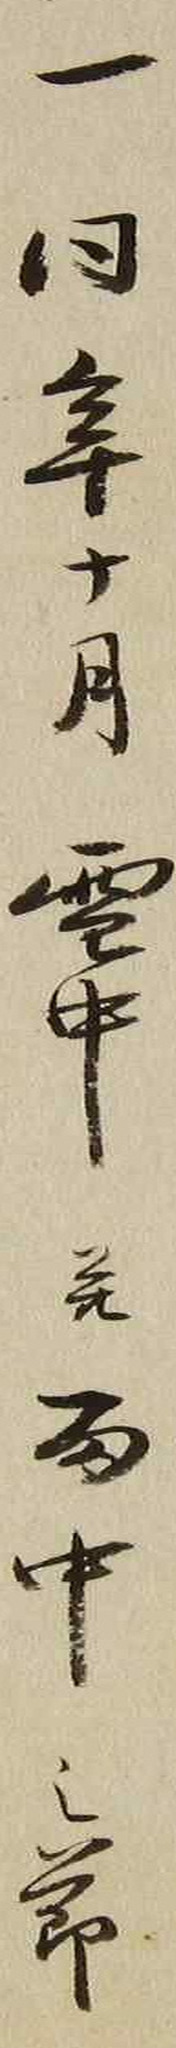一同年十月雷中并雨中之節
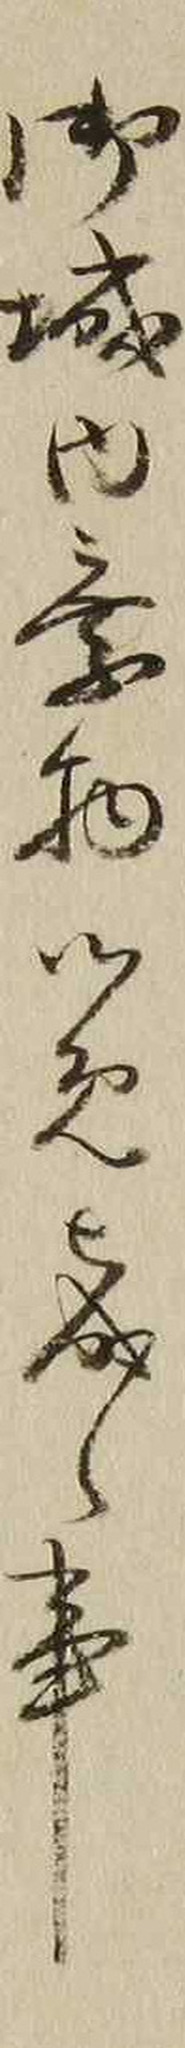御城内乗物御免被成候事
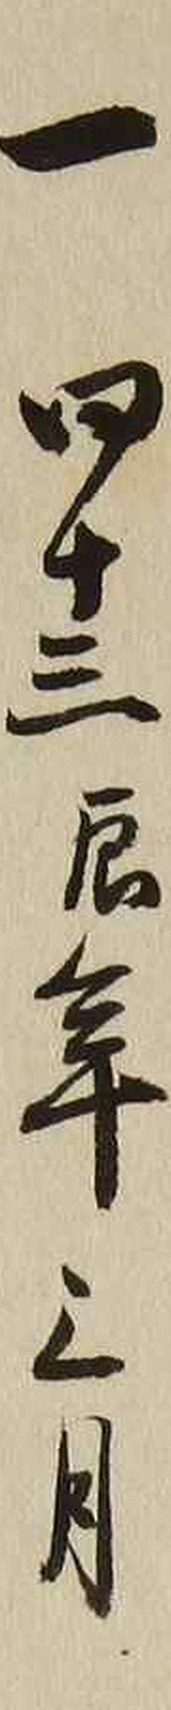一同十三辰年三月
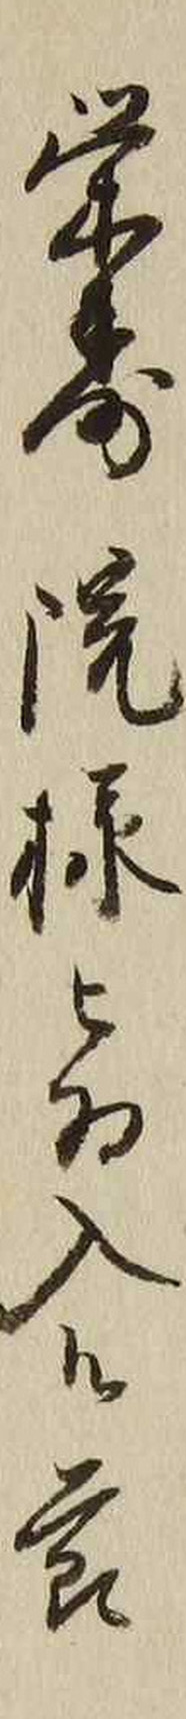栄寿院様被為入候節
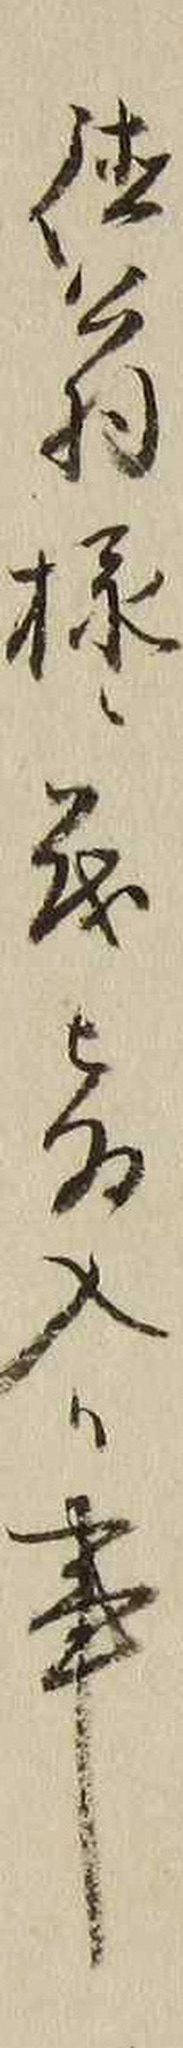徳翁様にも被為入候事
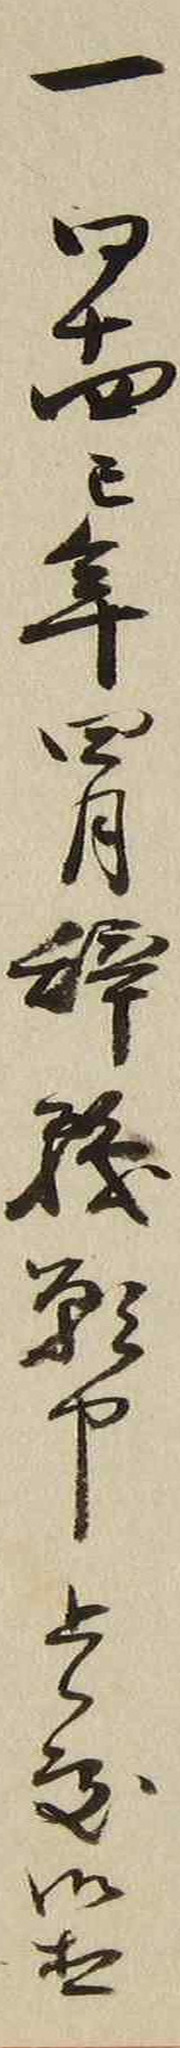一同十四巳年四月辞職願申上候処御直
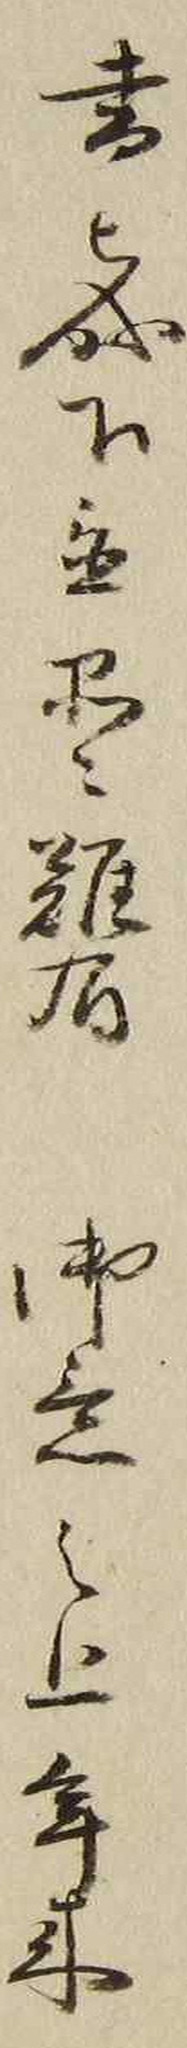書被成下置品々難有御意之上年来
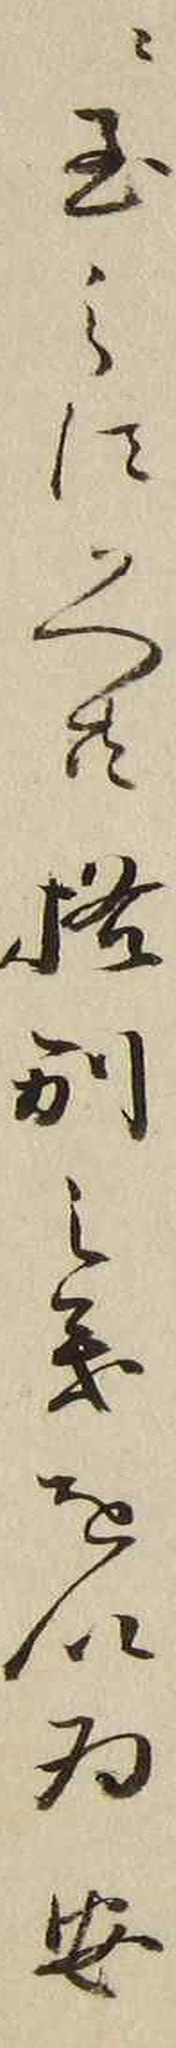に至之仕候へ共格別之義を以為安
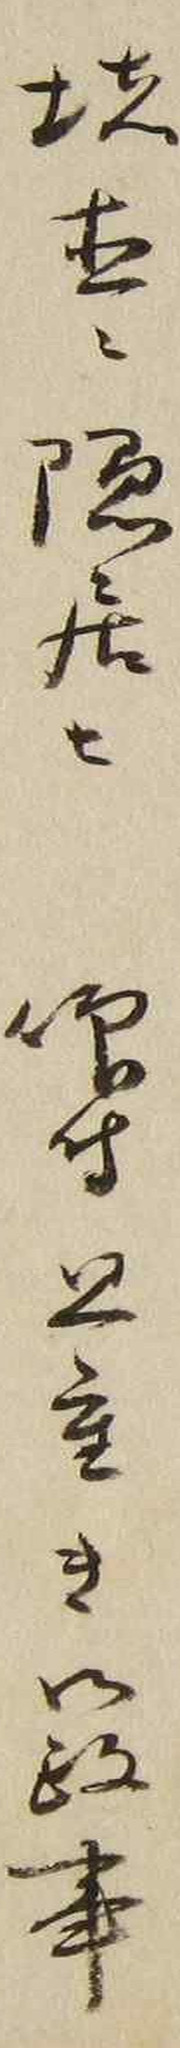堵直々隠居被仰付且重き御政事

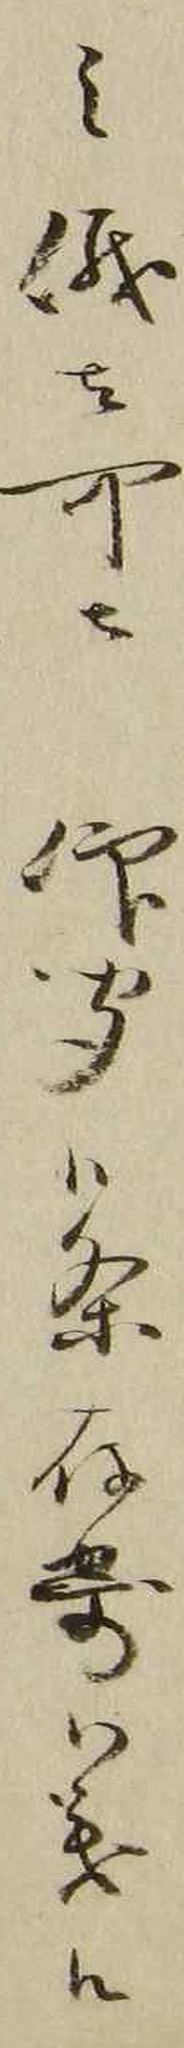之儀は可被仰聞候条存寄御義候
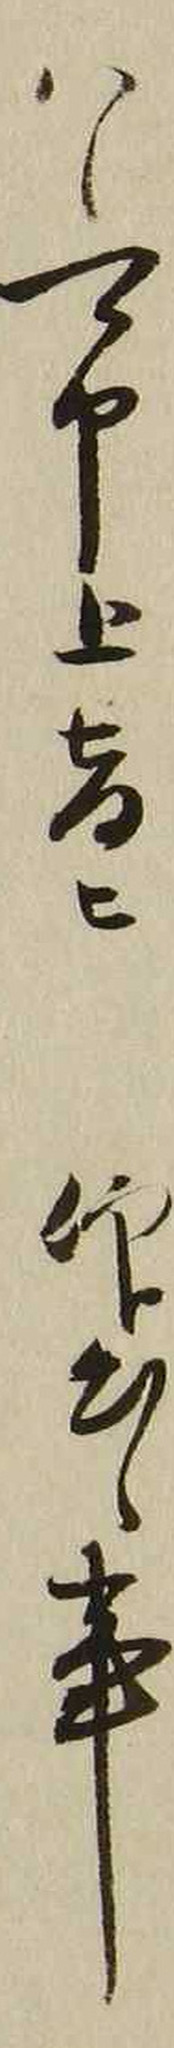はゝ可申上旨被仰出候事
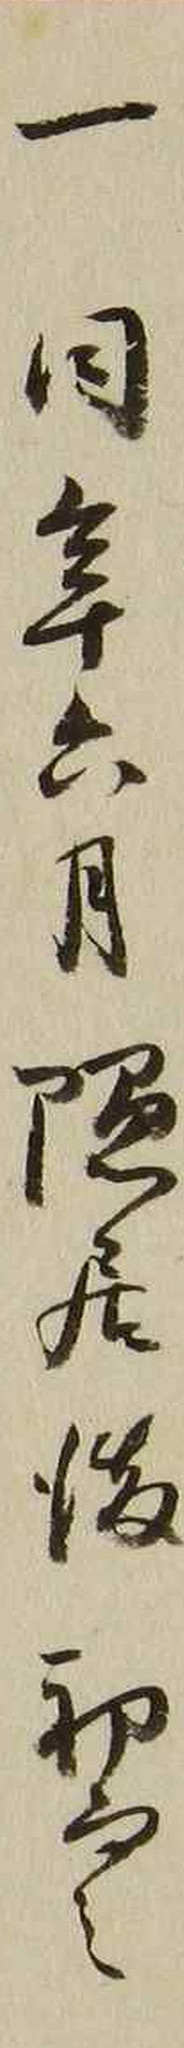一同年六月隠居後初而之
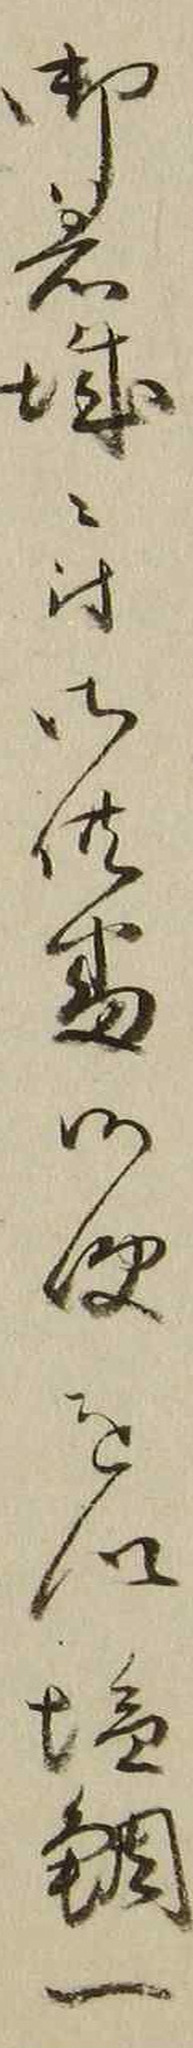御着城に付御供番御使を以塩鯛一
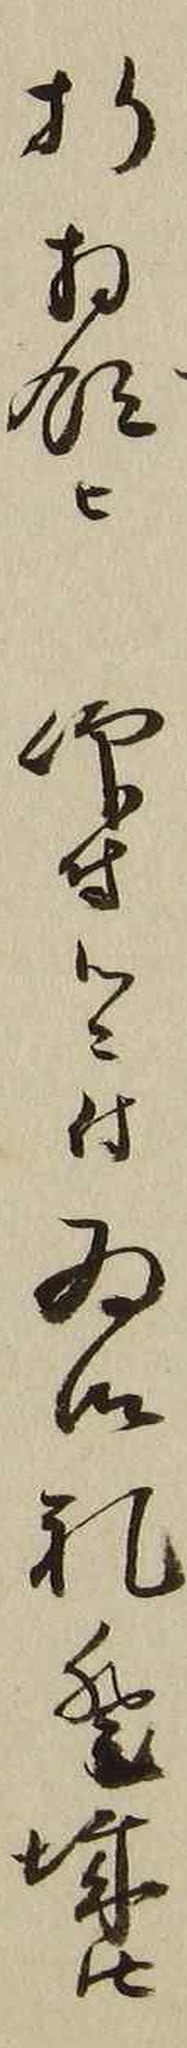折拝領被仰付に付為御礼登城仕
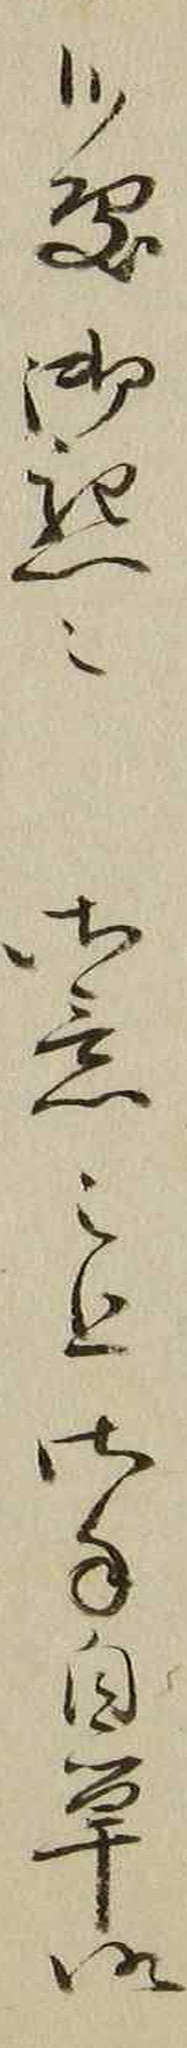候処御懇之御意之上御手自単御
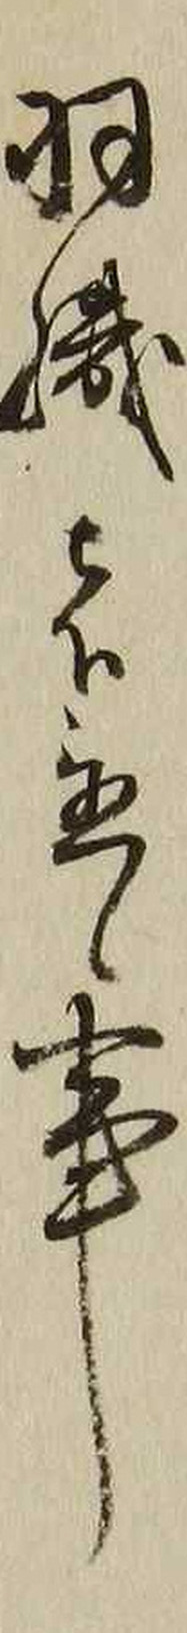羽織被下置候事
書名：諸士系譜　巻之269　さ之部1
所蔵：会津若松市立会津図書館
